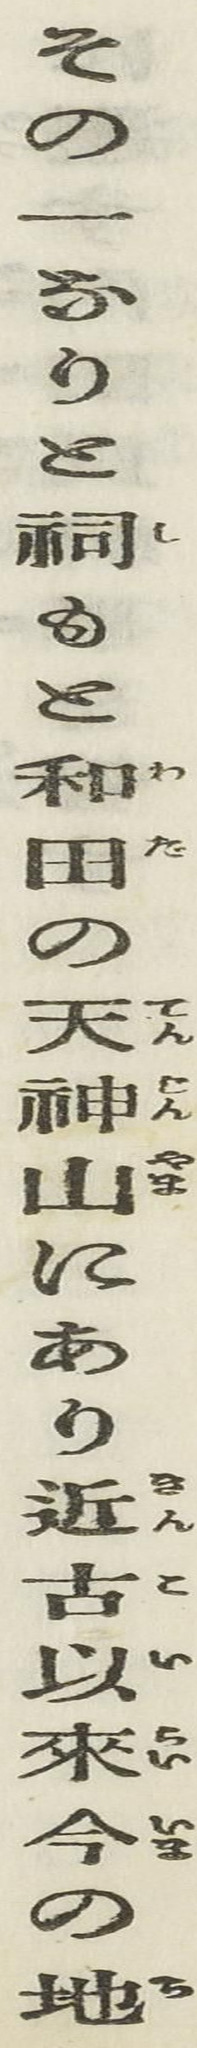その一なりと祠もと和田の天神山にあり近古以来今の地

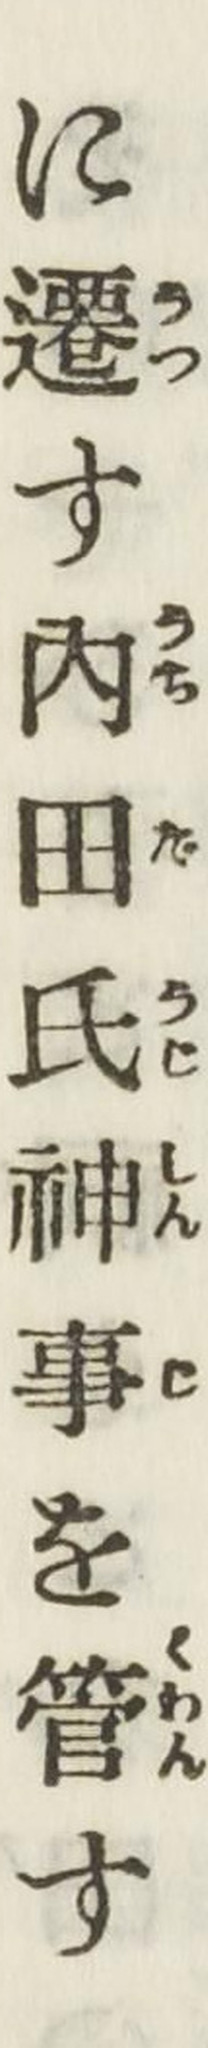に遷す内田氏神事を管す
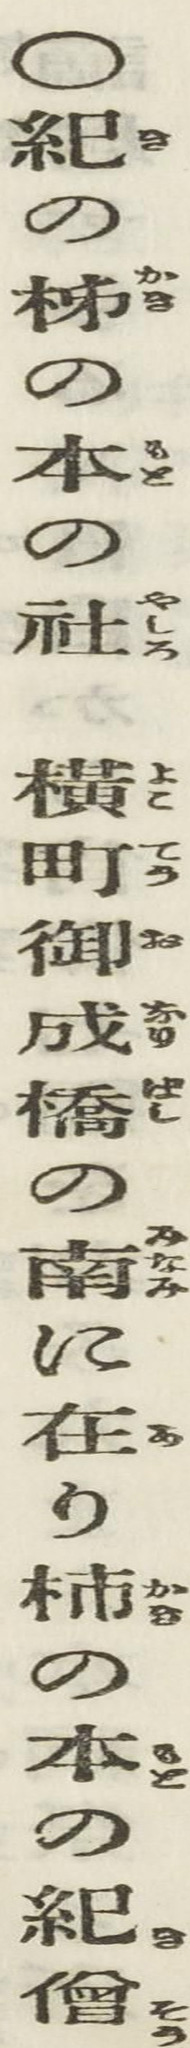○紀の柿の本の社横町御成橋の南に在り柿の本の紀僧
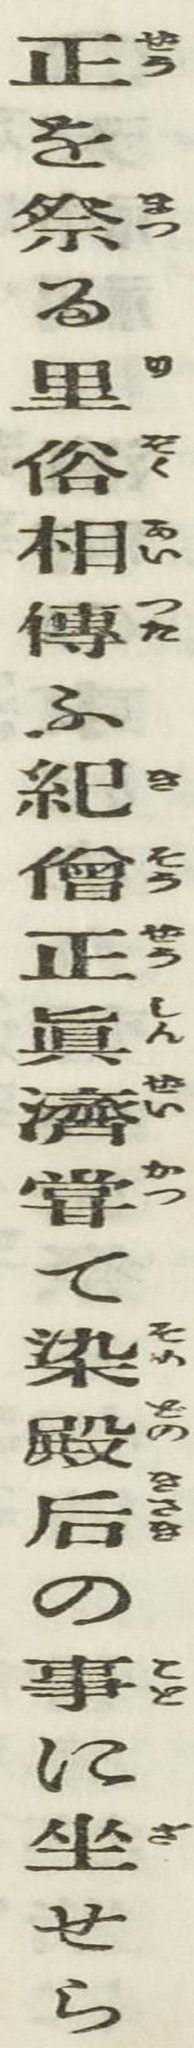正を祭る里俗相伝ふ紀僧正眞濟嘗て染殿后の事に坐せら
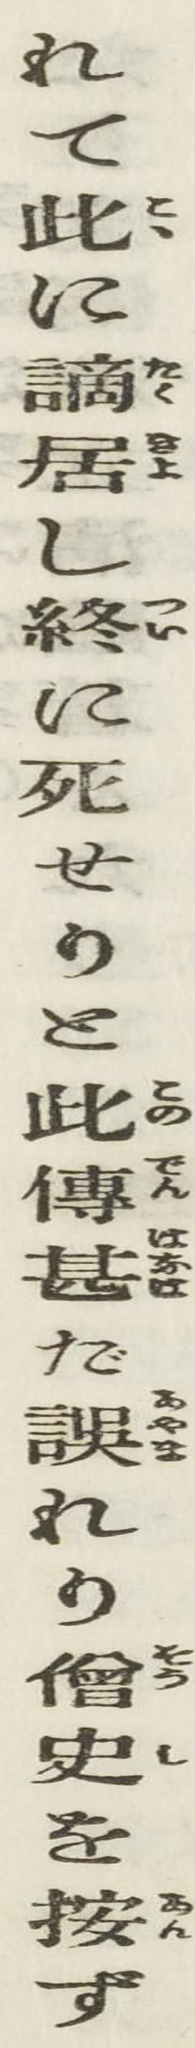れて此に謫居し終に死せりと此伝甚だ誤れり僧史を按ず
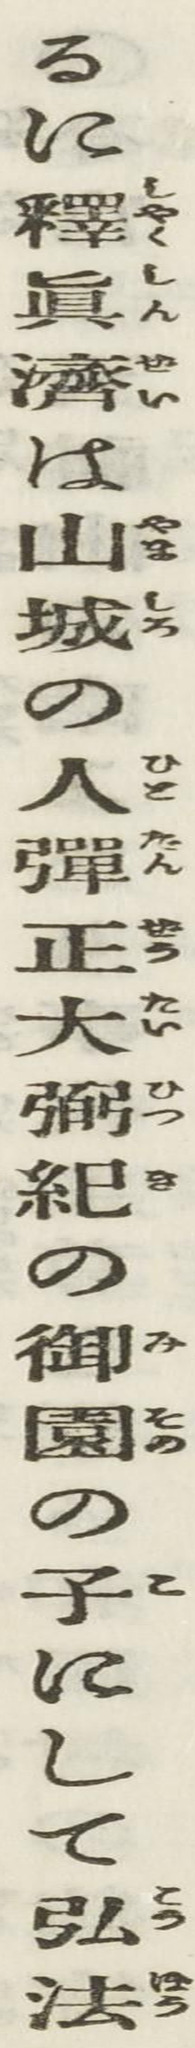るに釋眞濟は山城の人弾正大弼紀の御園の子にして弘法
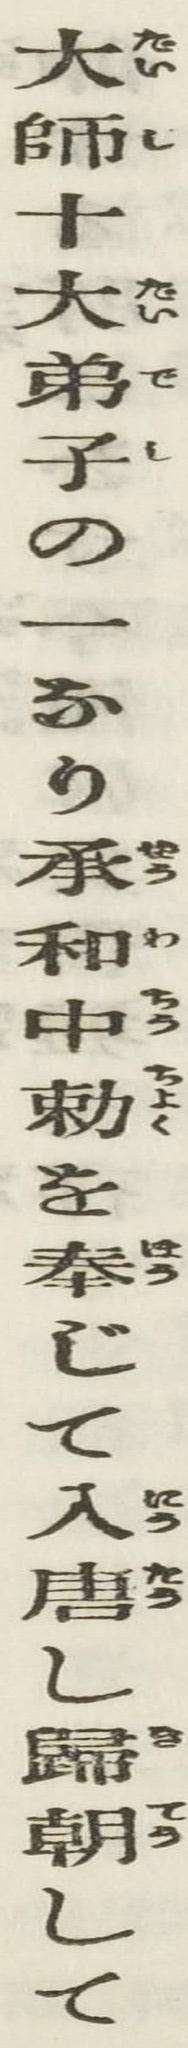大師十大弟子の一なり承和中勅を奉じて入唐し帰朝して
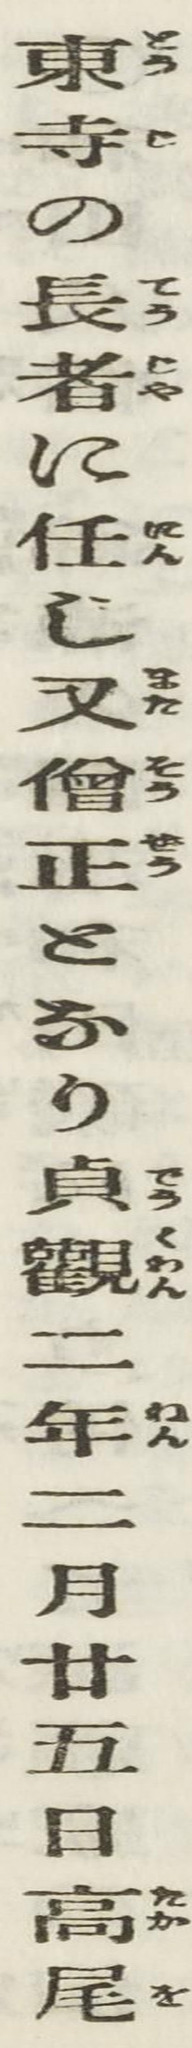東寺の長者に任じ又僧正となり貞観二年二月廿五日高尾
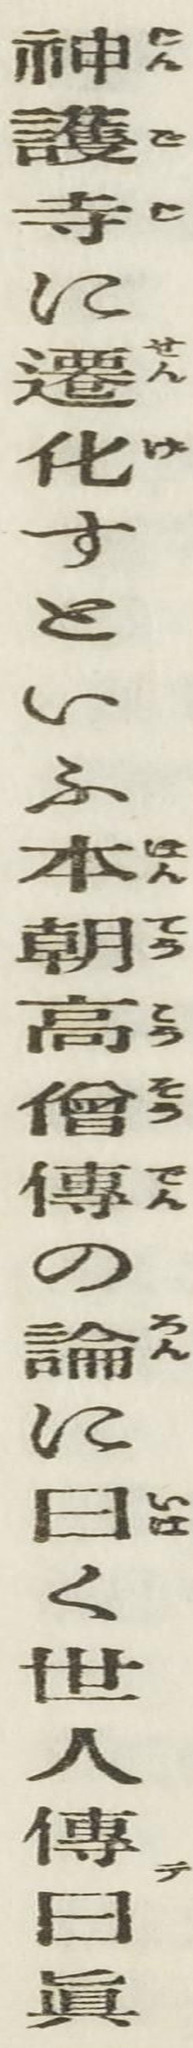神護寺に遷化すといふ本朝高僧伝の論に曰く世人傳曰眞
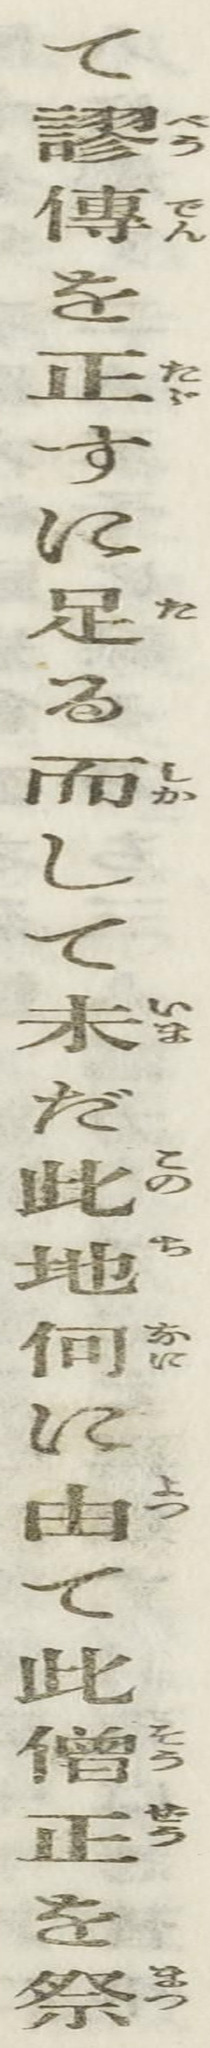て謬傳を正すに足る而して未だ此地何に由て此僧正を祭
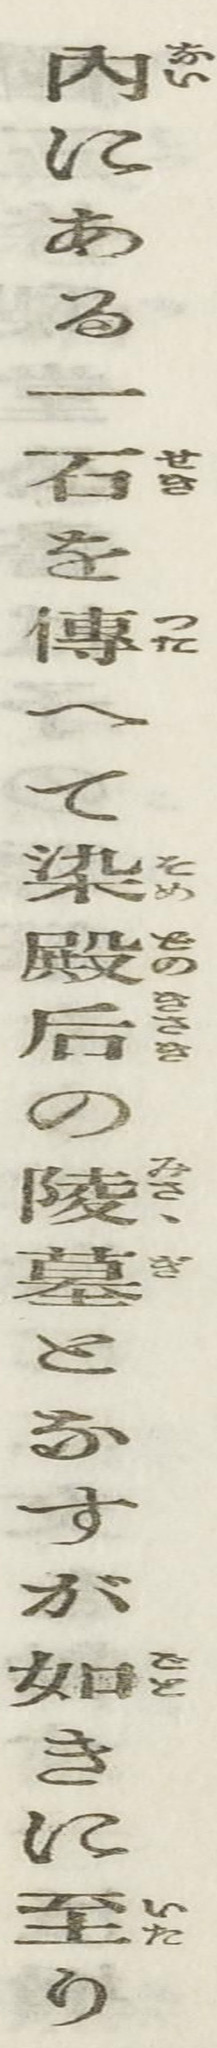内にある一石を伝へて染殿后の陵墓となすが如きに至り
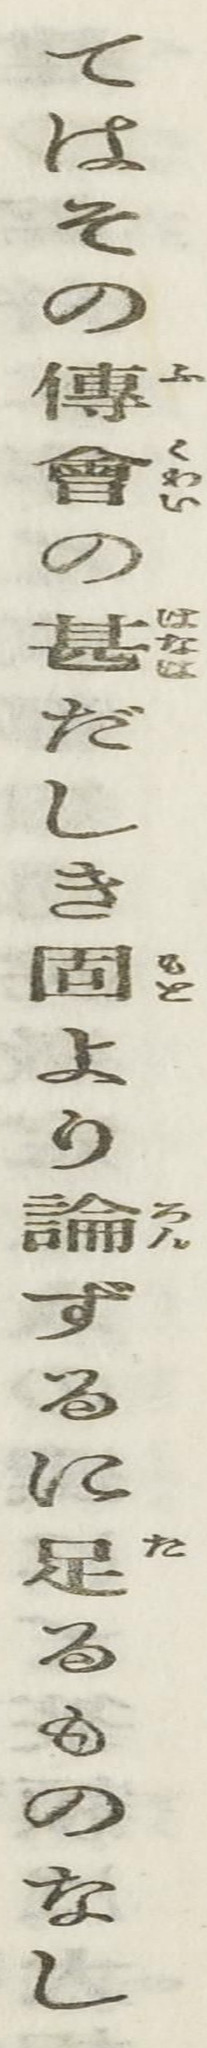てはその傅會の甚だしき固より論ずるに足るものなし
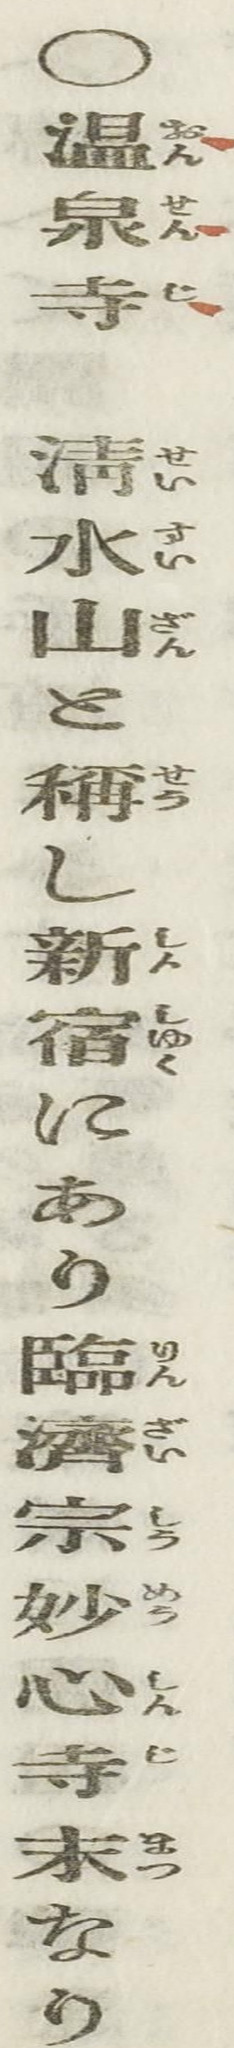○温泉寺清水山と称し新宿にあり臨済宗妙心寺末なり
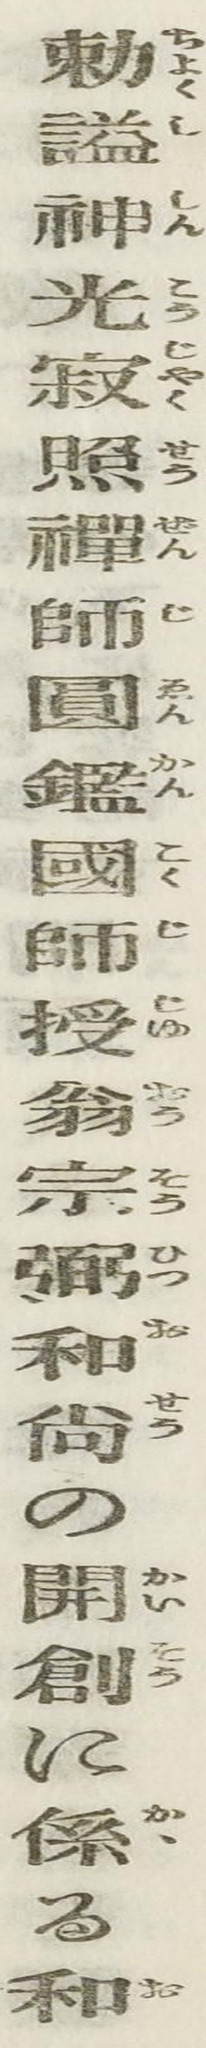勅謚神光寂照禅師圓鑑國師授翁宗弼和尚の開創に係る和
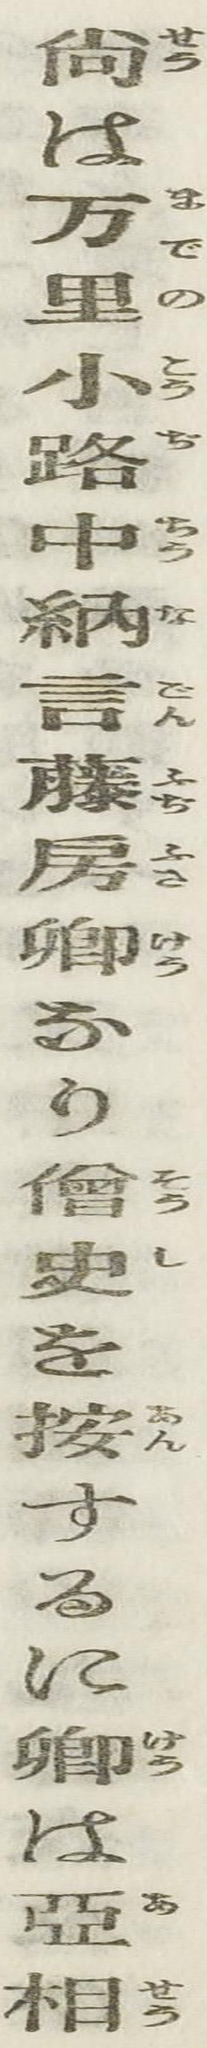尚は万里小路中納言藤房卿なり僧史を按するに卿は亞相
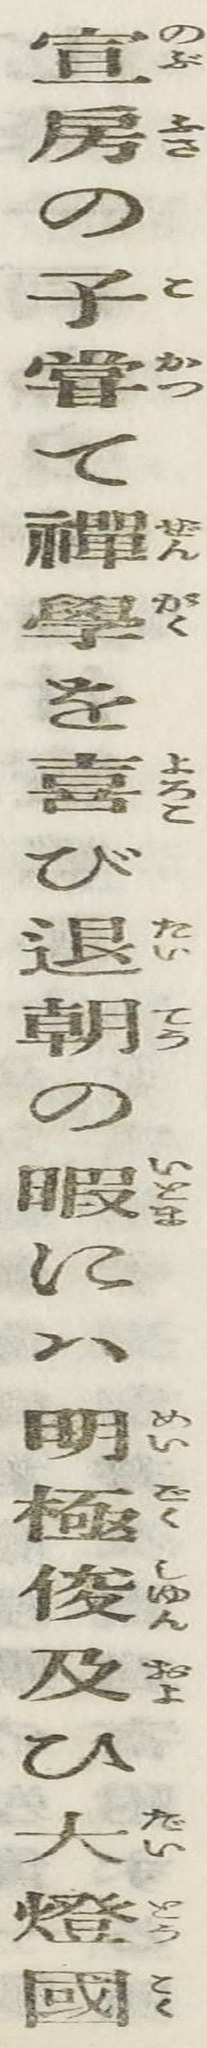宣房の子嘗て禅学を喜び退朝の暇には明極俊及ひ大燈國
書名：熱海獨案内　全
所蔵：東京大学地震研究所図書室 Earthquake Research Institute Library, The University of Tokyo, JAPAN
